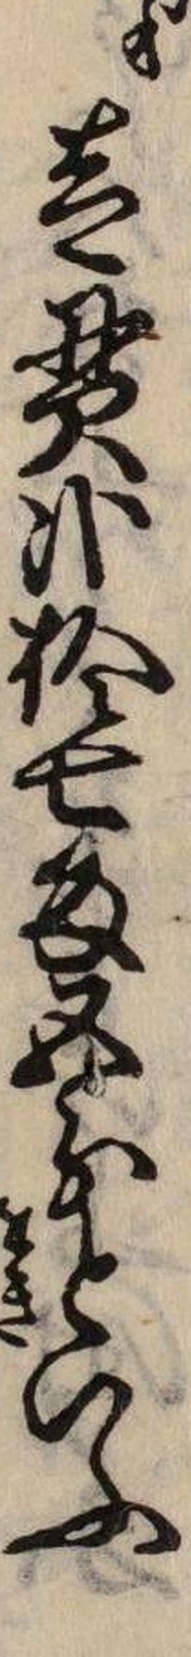利壱貫弐拾七匁五分といふ
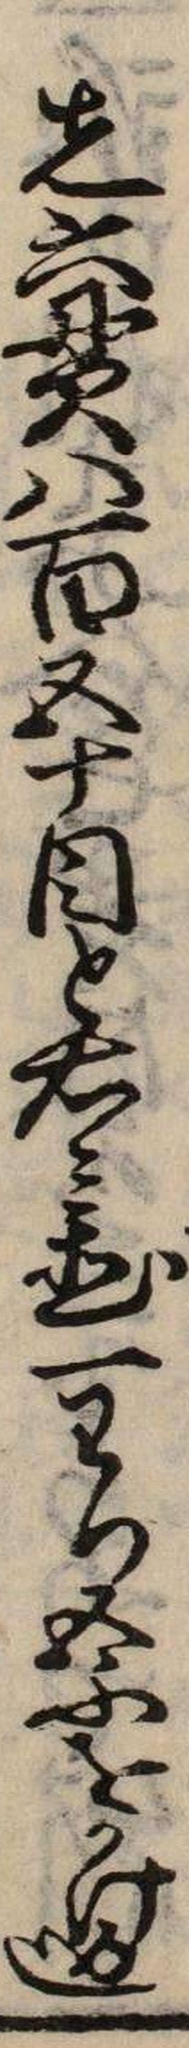先六貫八百五十目と右に置一わり五ふをかける也
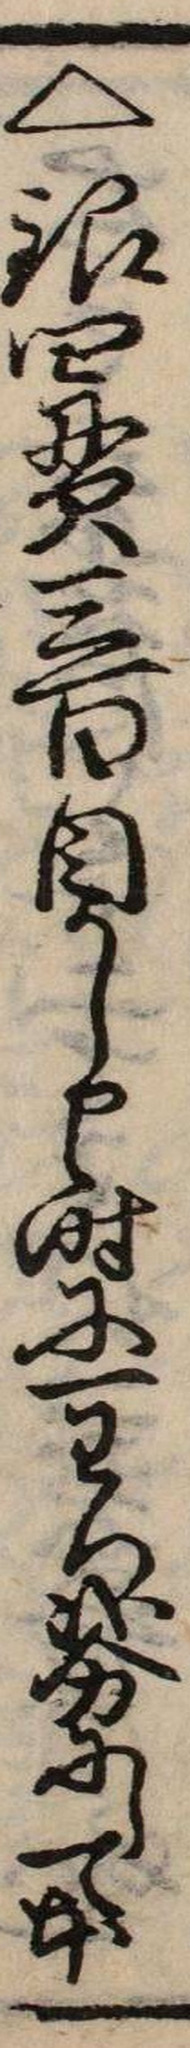△銀四貫三百目かし申時に一わり弐分にして本
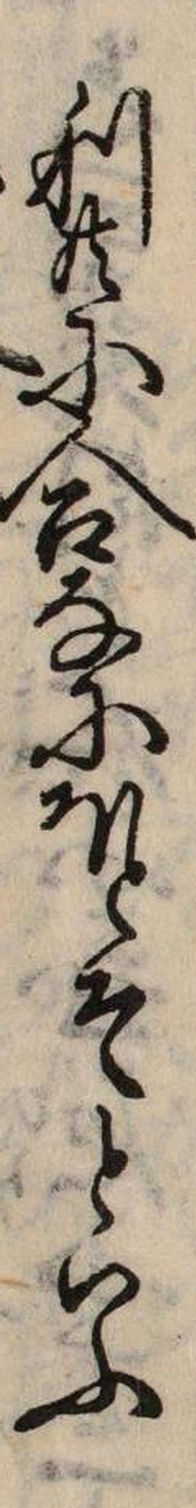利共に合なにほとそといふ
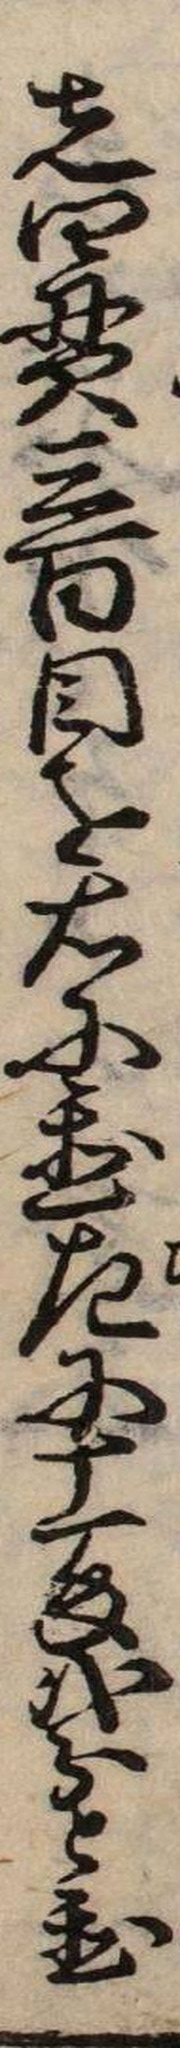先四貫三百目を右に置左に十一匁弐分と置
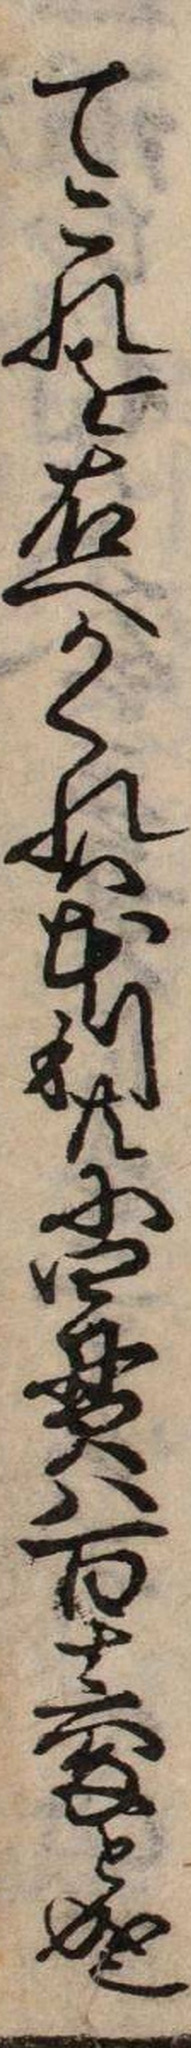てこれを右へかくれは本利共に四貫八百十六匁と成也

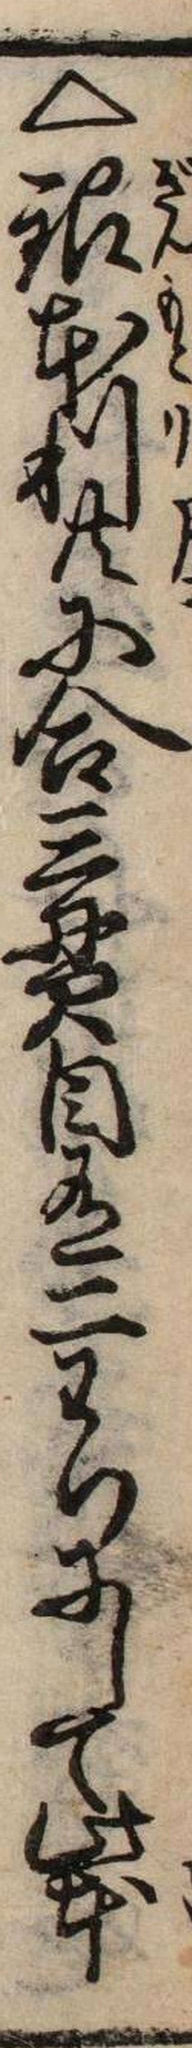△銀本利共に合三貫目有二わりにして此本
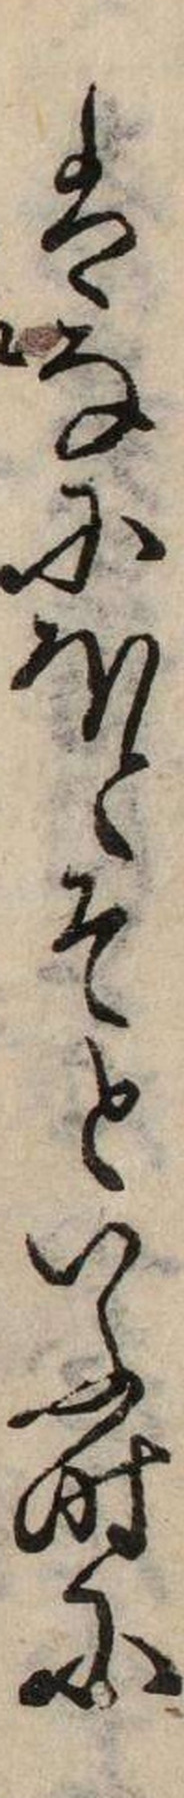はなにほとそといふ時に
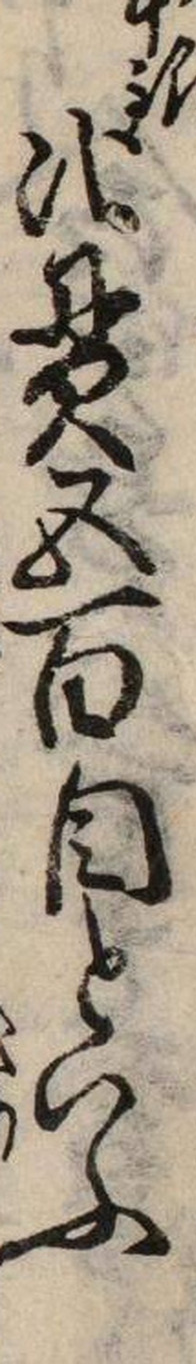本銀弐貫五百目といふ
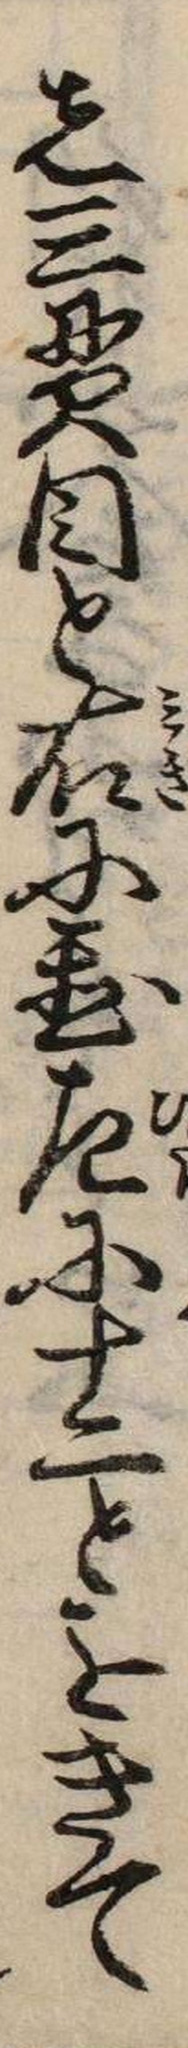先三貫目と右に置左に十二とをきて
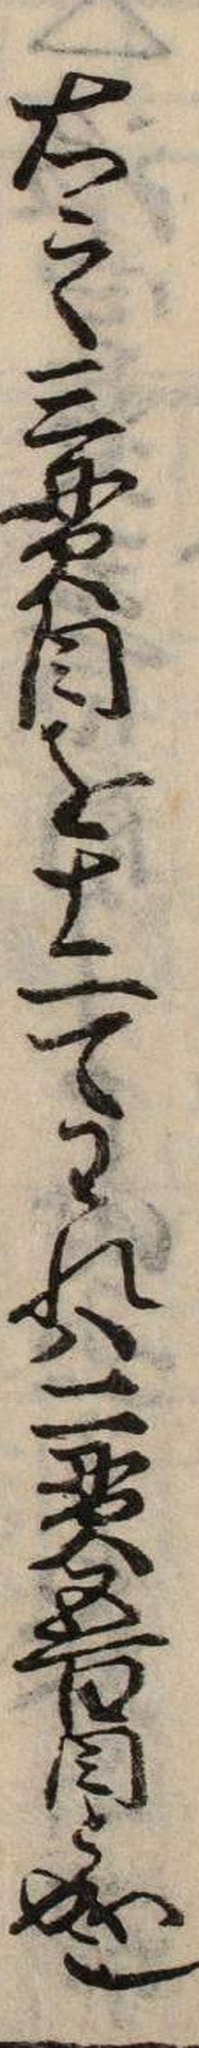右の三貫目を十二てわれは二貫五百目と成也
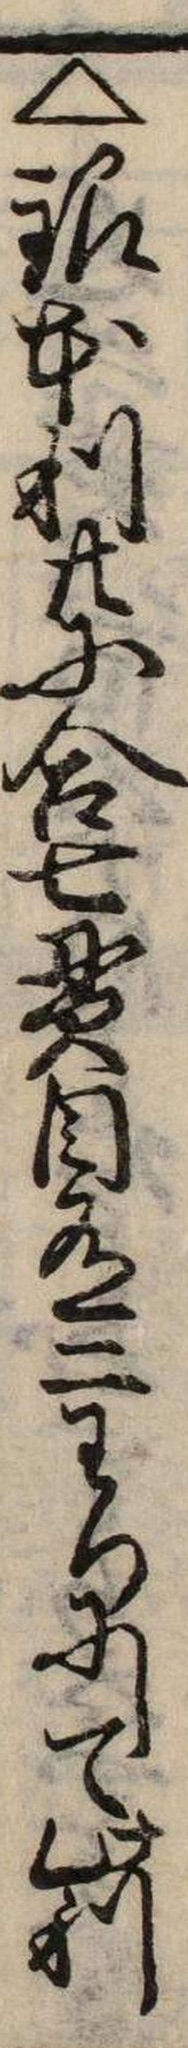△銀本利共に合七貫目有二わりにして此利
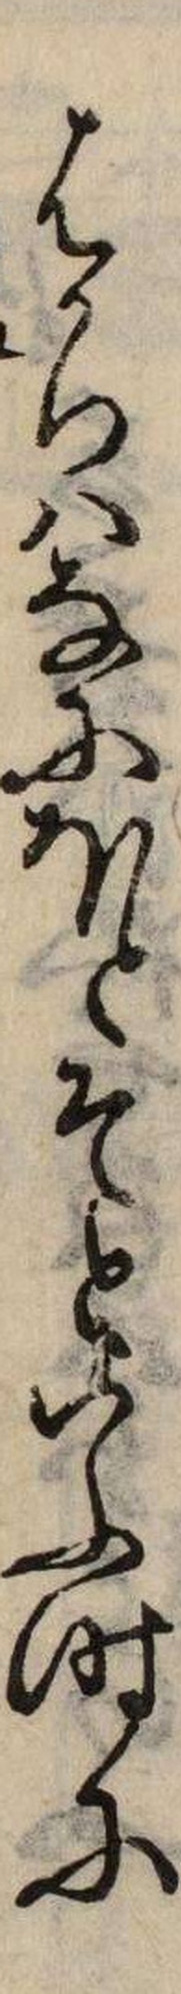はかりはなにほとそといふ時に
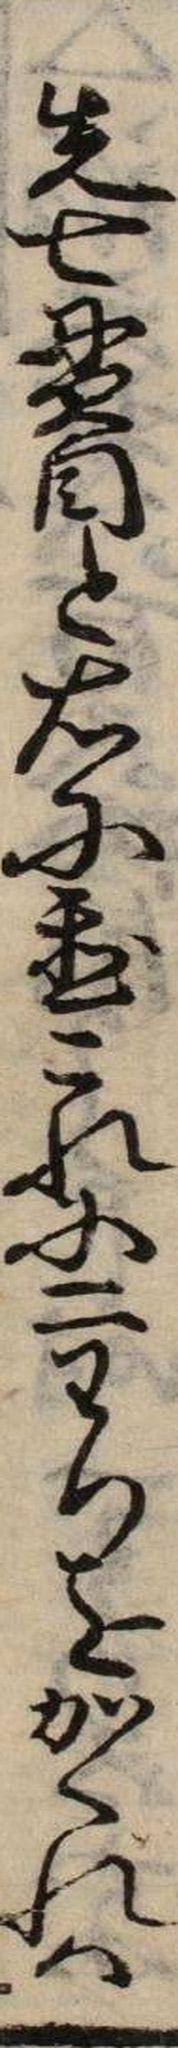先七貫目と右に置これに二わりをかくれは
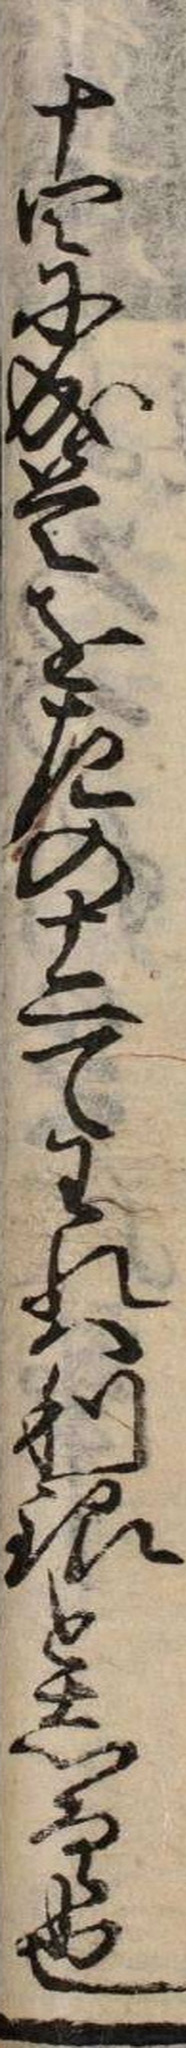十四に成是を左の十二てわれは利銀としるゝ也
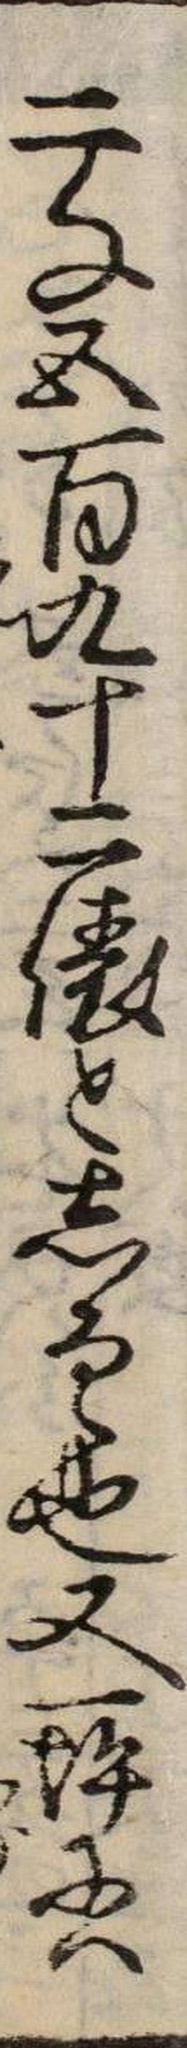二千五百九十二俵としるゝ也又一坪には
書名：塵劫記（寛永11年自跋、京都府立京都学・歴彩館追貴8）
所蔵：京都府立京都学・歴彩館 国文学研究資料館
